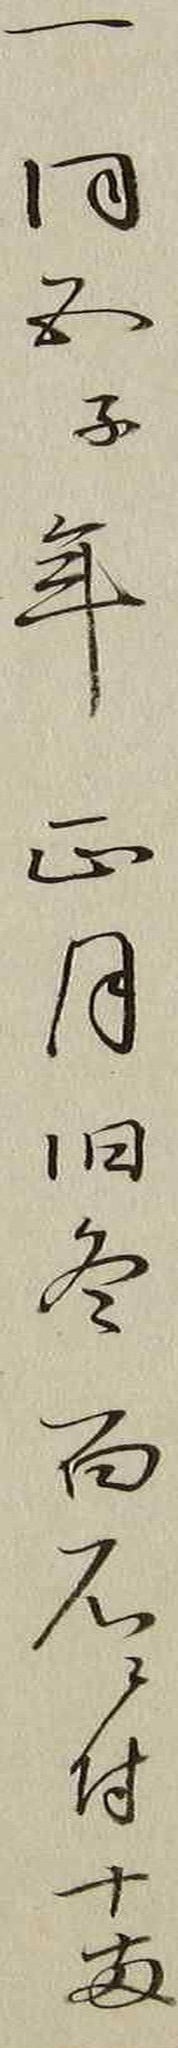一同五子年正月旧冬百石ニ付十両
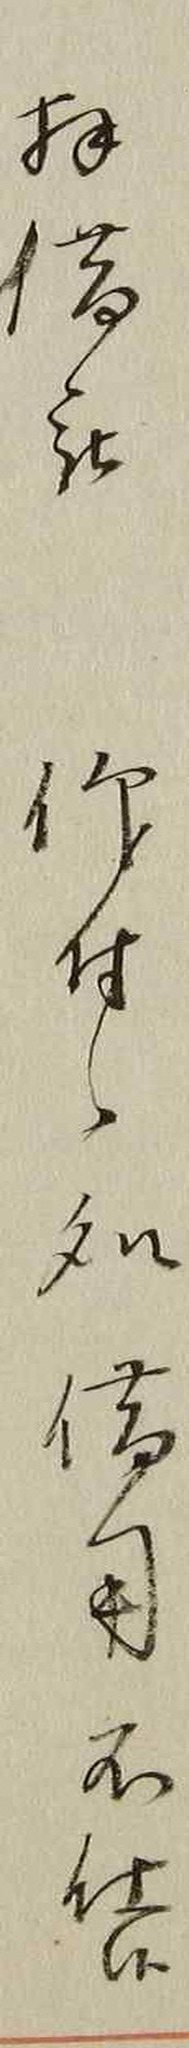拝借被仰付候処借用不仕候
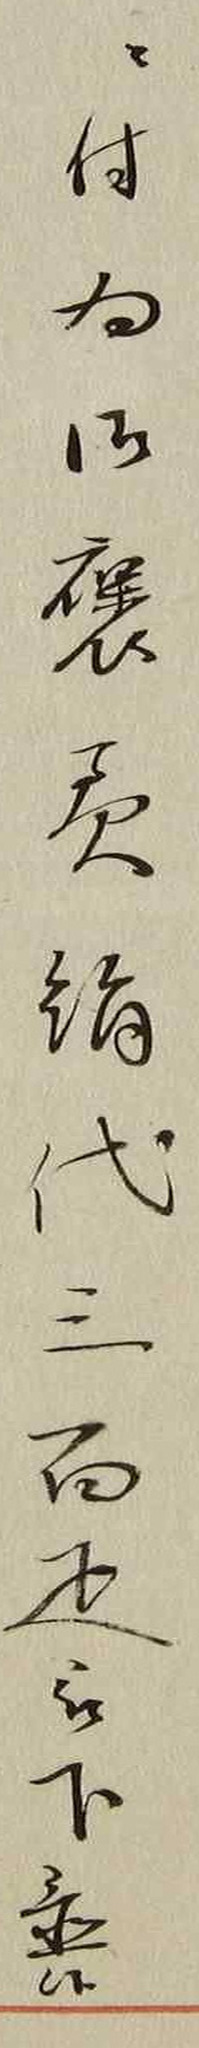ニ付為御褒美絹代三百疋被下置候
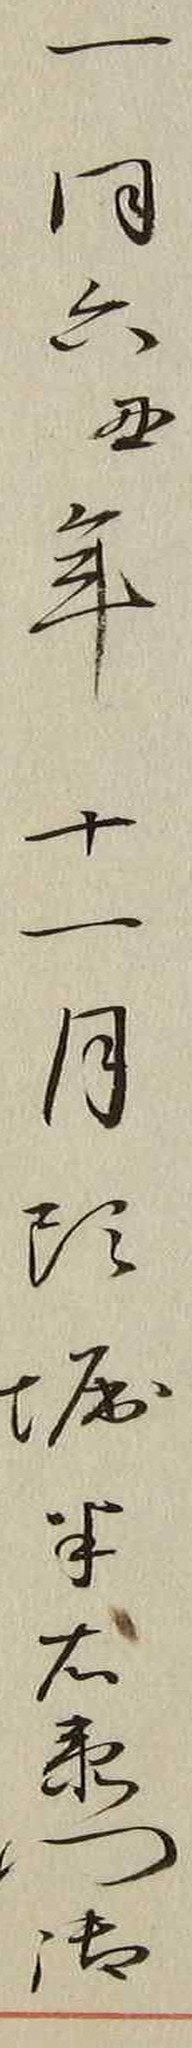一同六丑年十一月頭堀半右衛門御
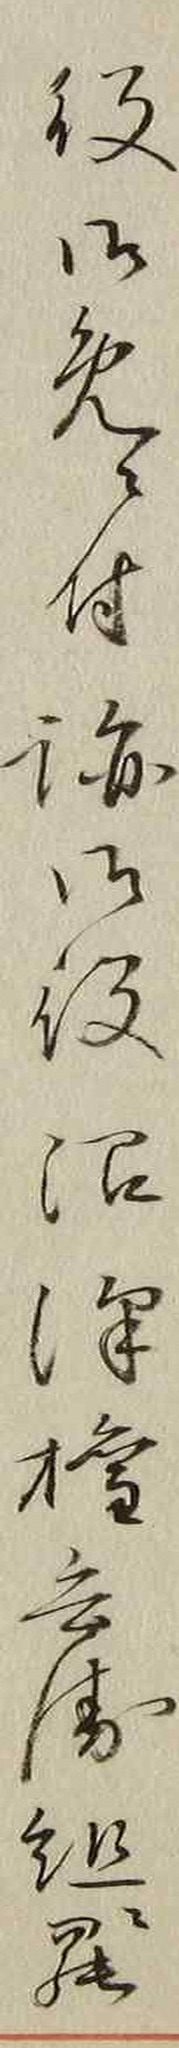役御免ニ付跡御役沼沢権兵衛組ニ罷
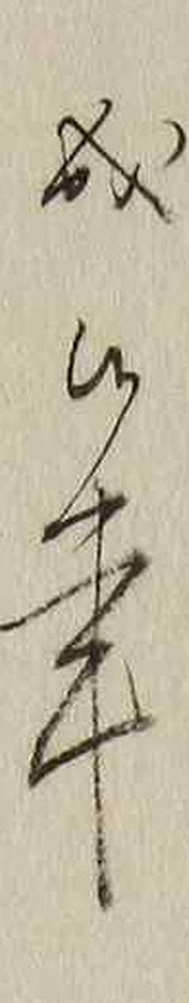成候事
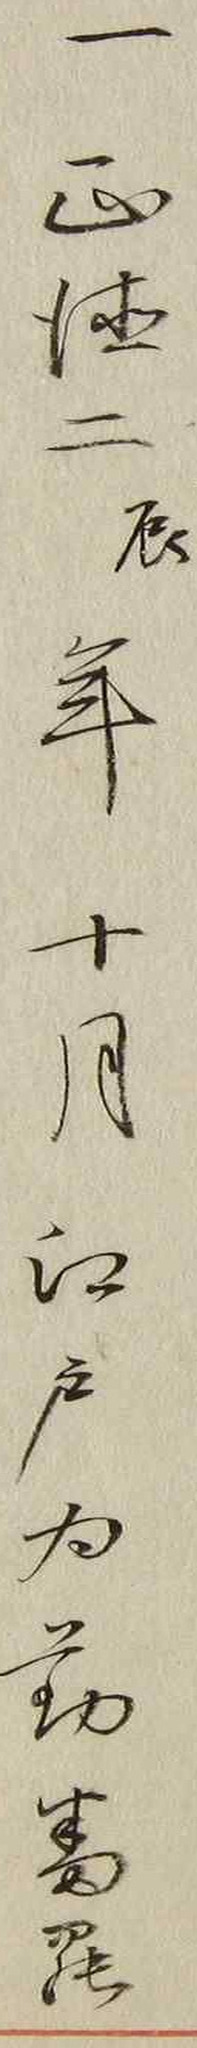一正徳二辰年十月江戸為勤番罷
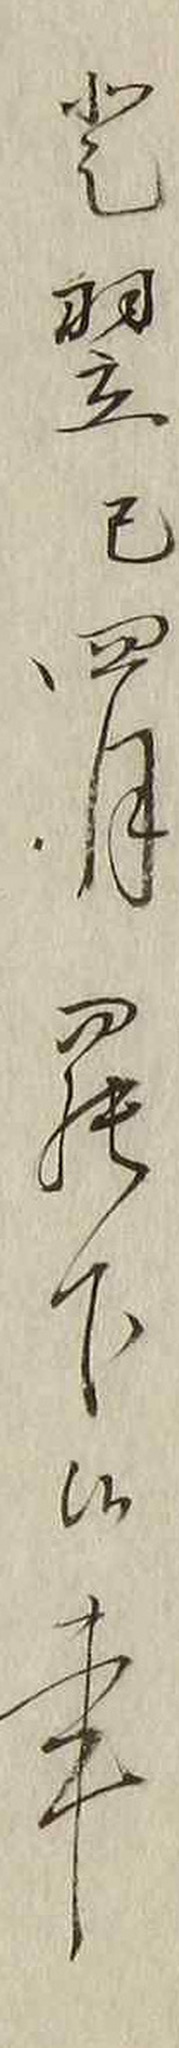登翌巳四月罷下候事
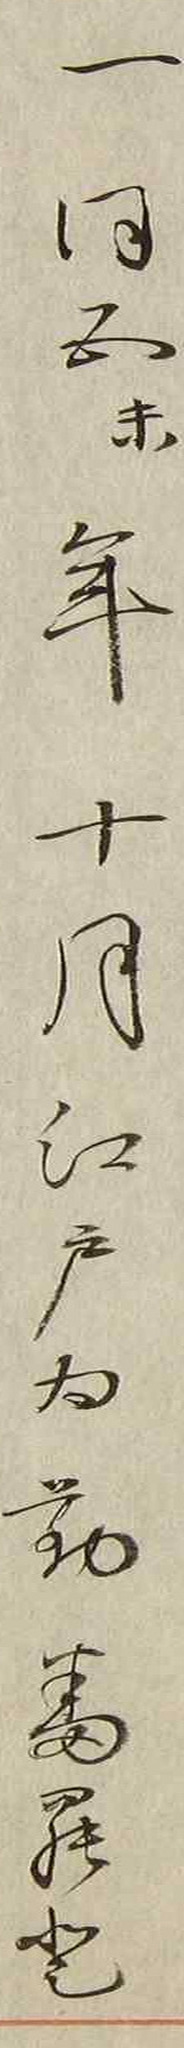一同五未年十月江戸為勤番罷登
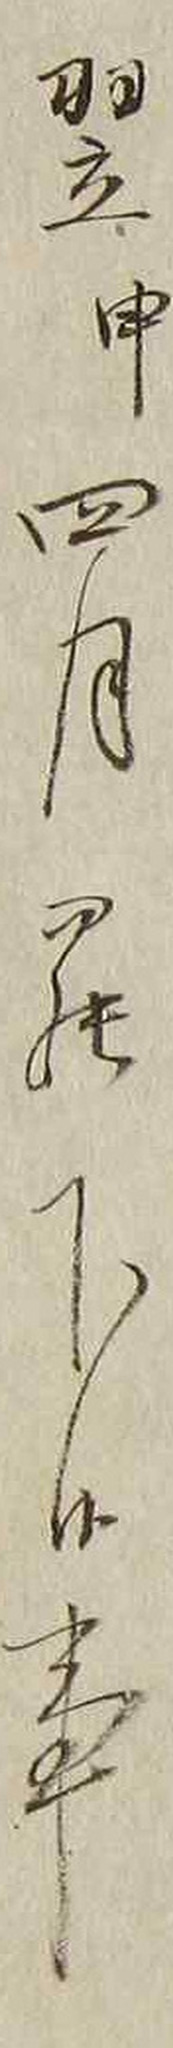翌申四月罷下候事
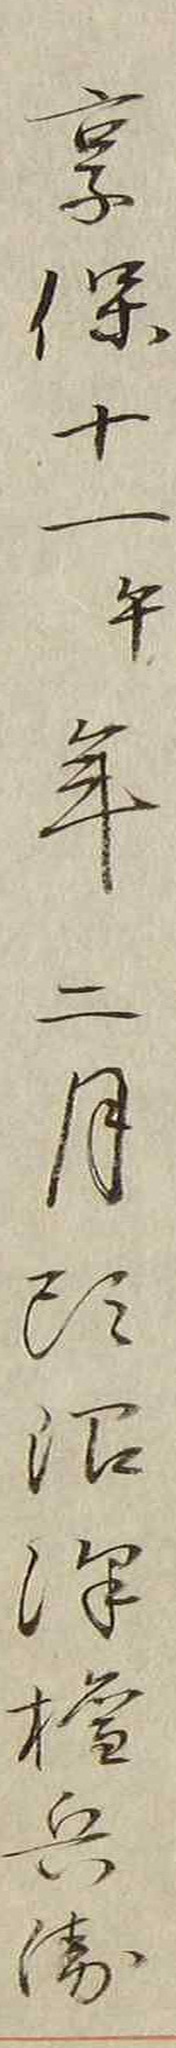一享保十一午年二月頭沼沢権兵衛

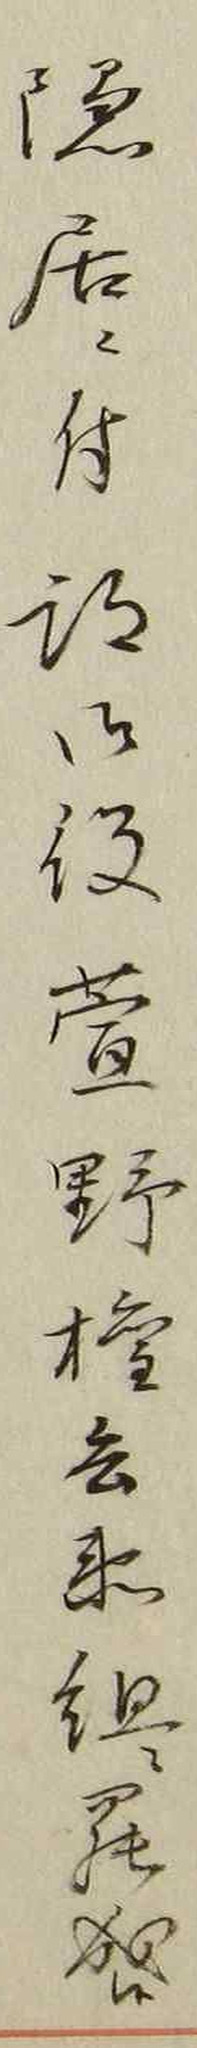隠居ニ付跡御役萱野権兵衛組ニ罷成候
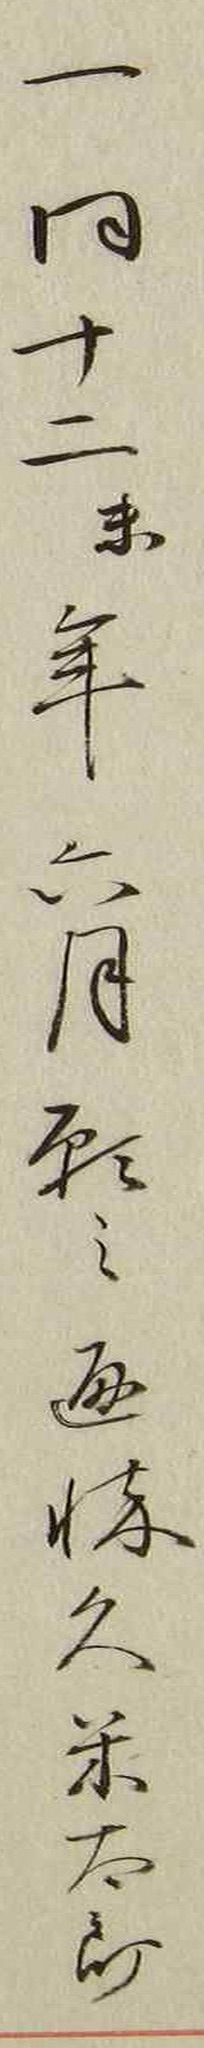一同十二未年六月願之通悴久米太郎
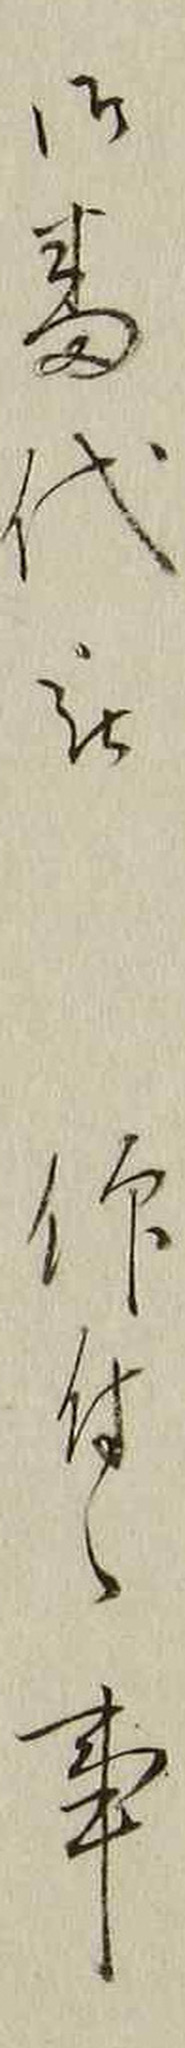御番代被仰付候事
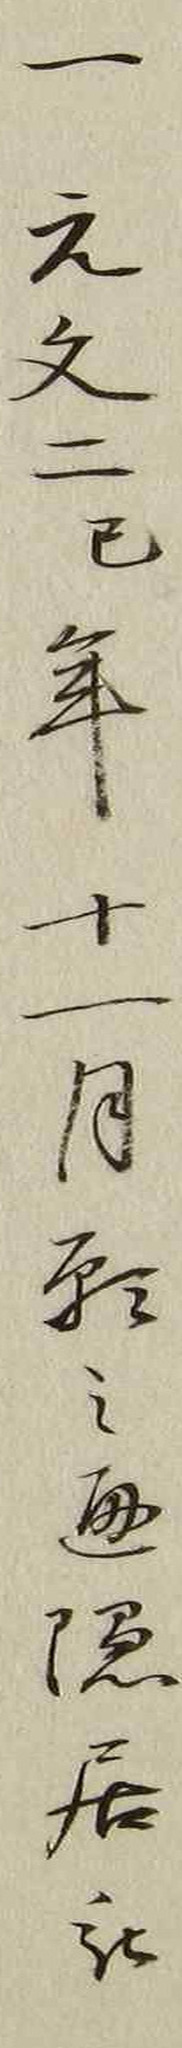一元文二巳年十一月願之通隠居被
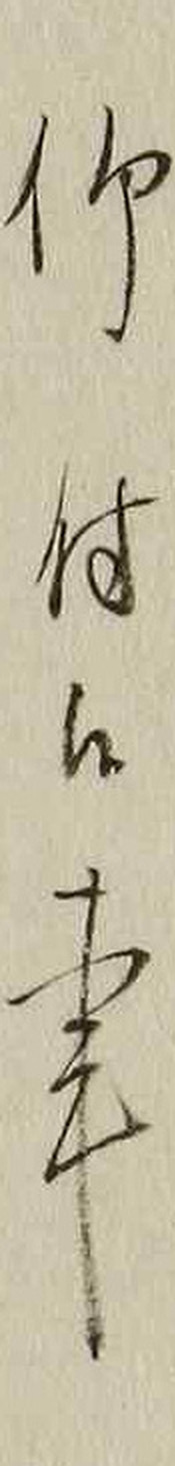仰付候事
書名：諸士系譜　巻之22　い之部22
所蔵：会津若松市立会津図書館
